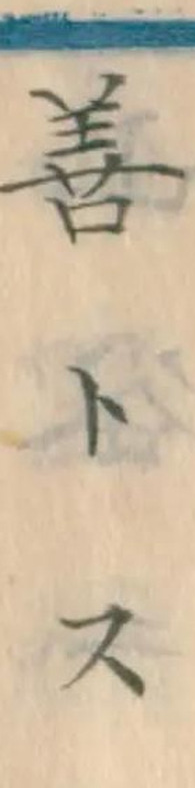善トス
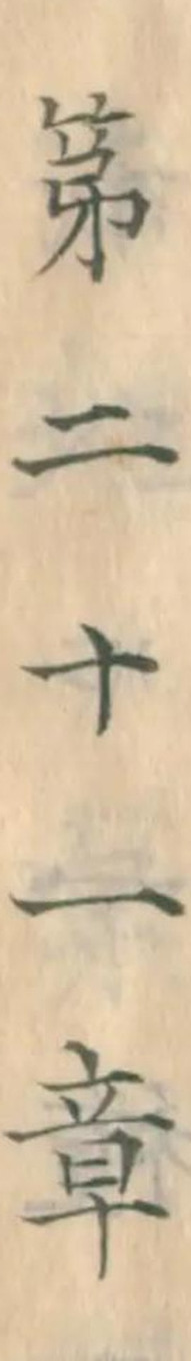第二十一章

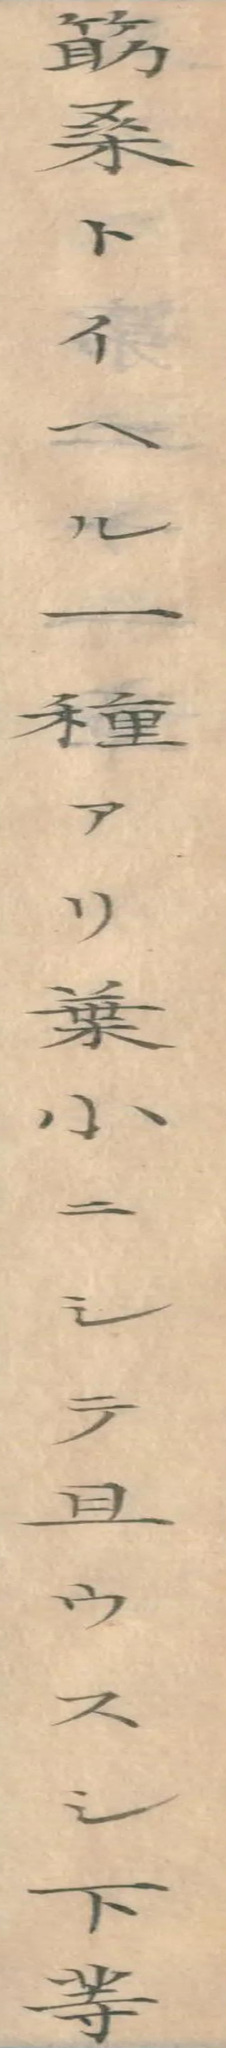筋桑トイヘル一種アリ葉小ニシテ且ウスシ下等
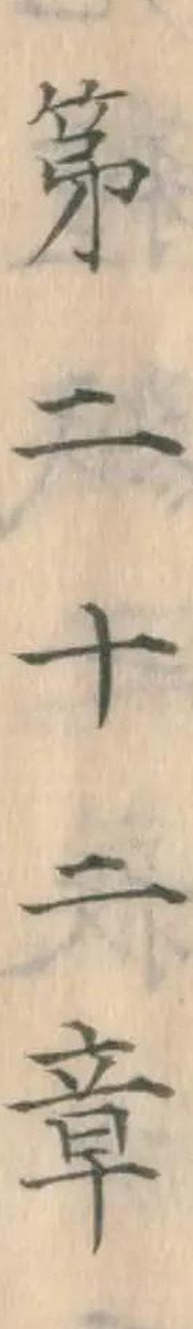第二十二章
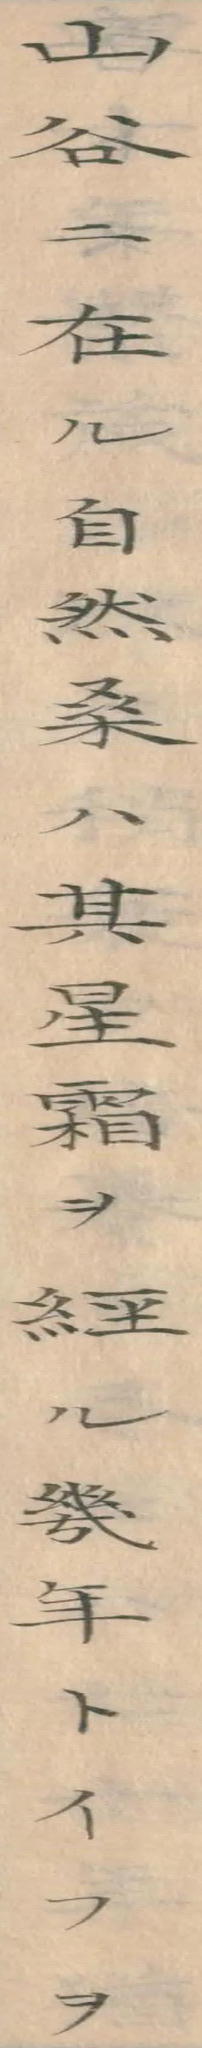山谷ニ在ル自然桑ハ其星霜ヲ経ル幾年トイフヲ
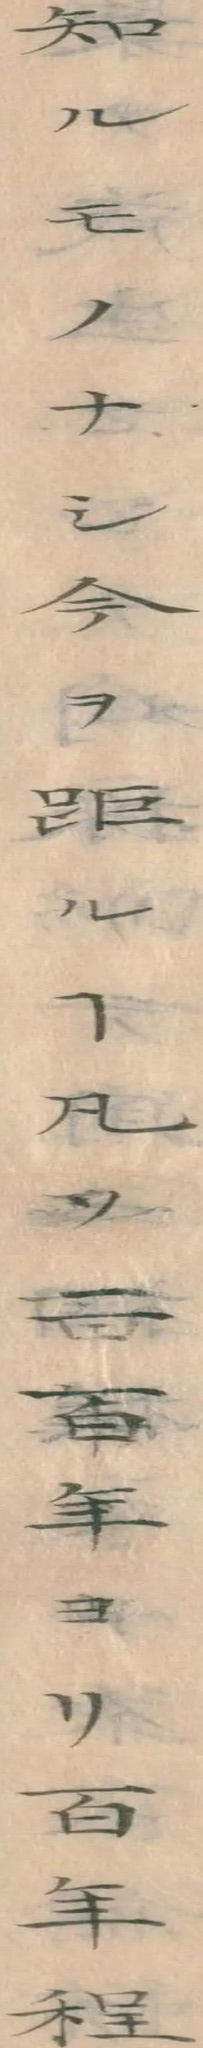知ルモノナシ今ヲ距ルコト凡ソ二百年ヨリ百年程
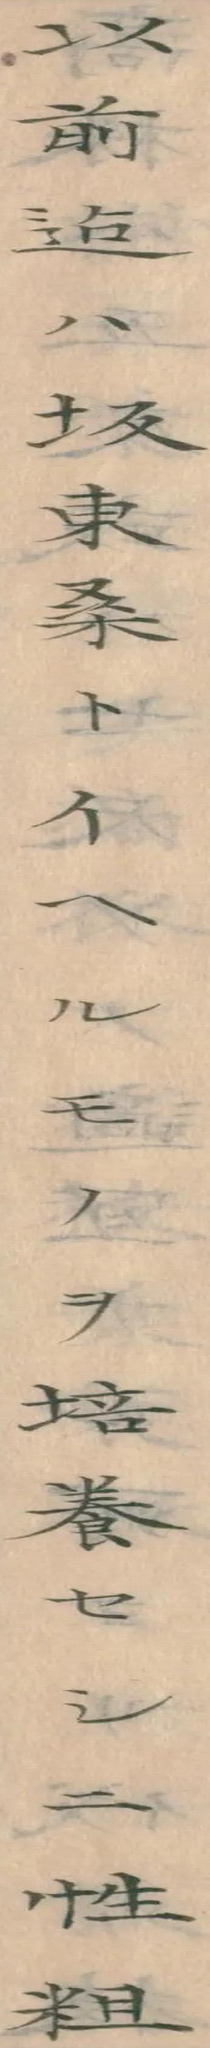以前迄ハ坂東桑トイヘルモノヲ培養セシニ性粗
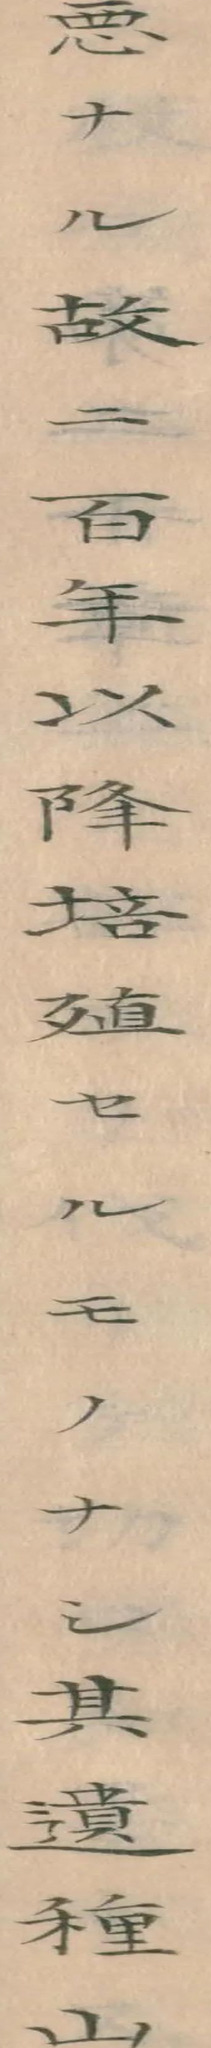悪ナル故ニ百年以降培殖セルモノナシ其遺種山
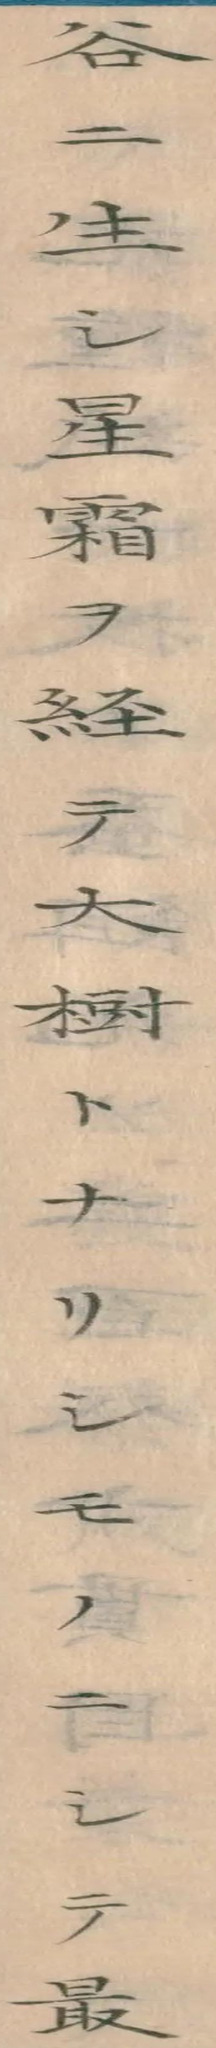谷ニ生シ星霜ヲ経テ大樹トナリシモノニシテ最
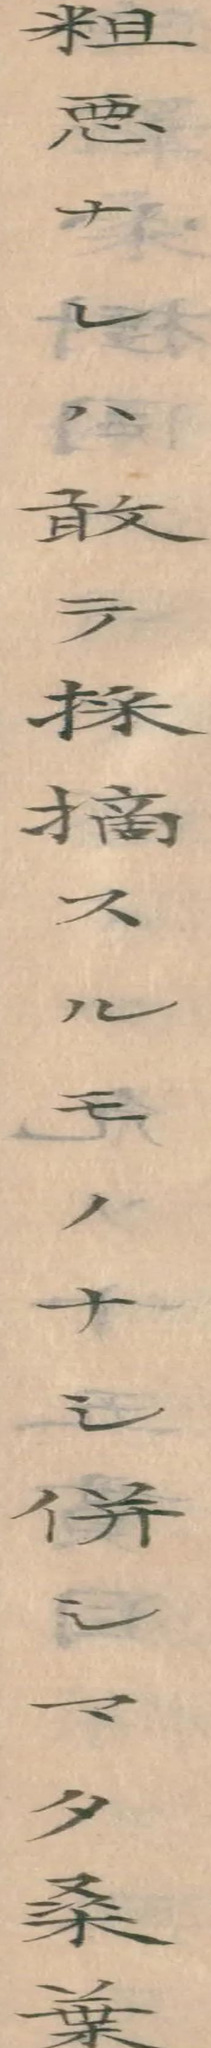粗悪ナレハ敢テ採摘スルモノナシ併シマタ桑葉
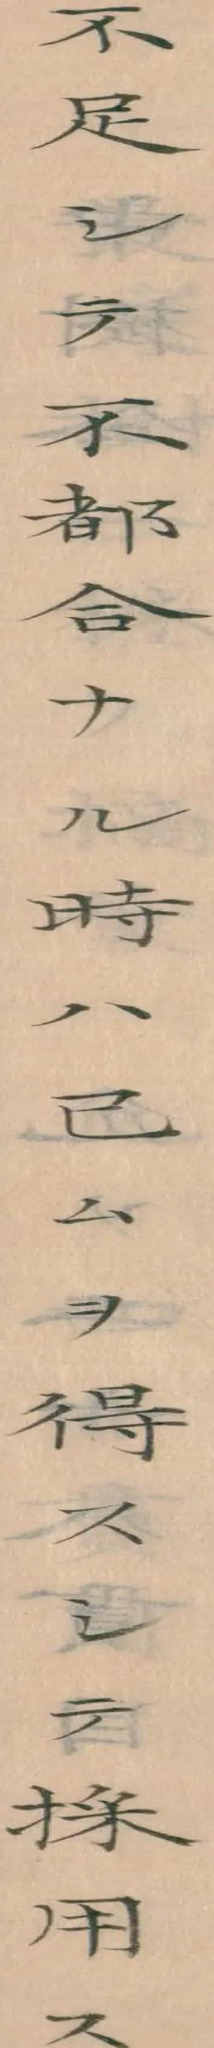不足シテ不都合ナル時ハ已ムヲ得スシテ採用ス
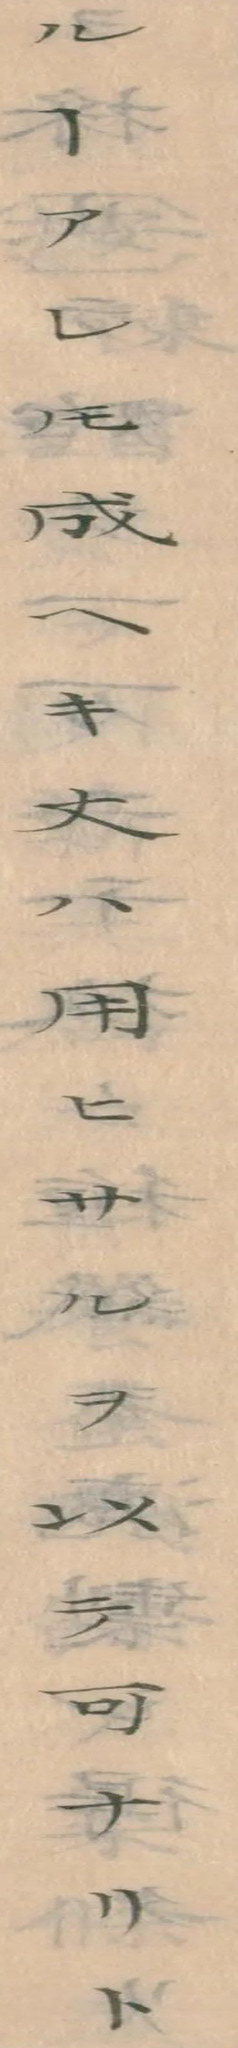ルコトアレトモ成ヘキ丈ハ用ヒサルヲ以テ可ナリト
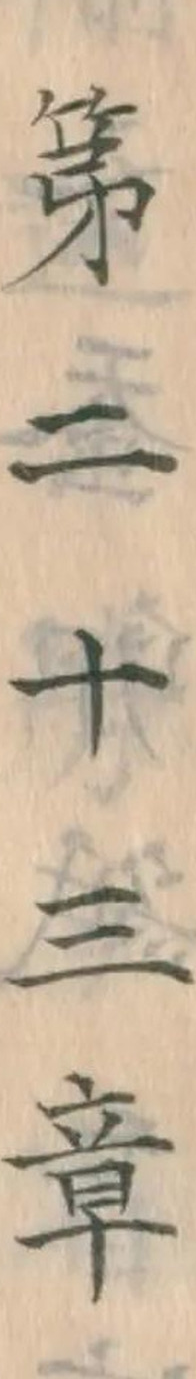第二十三章
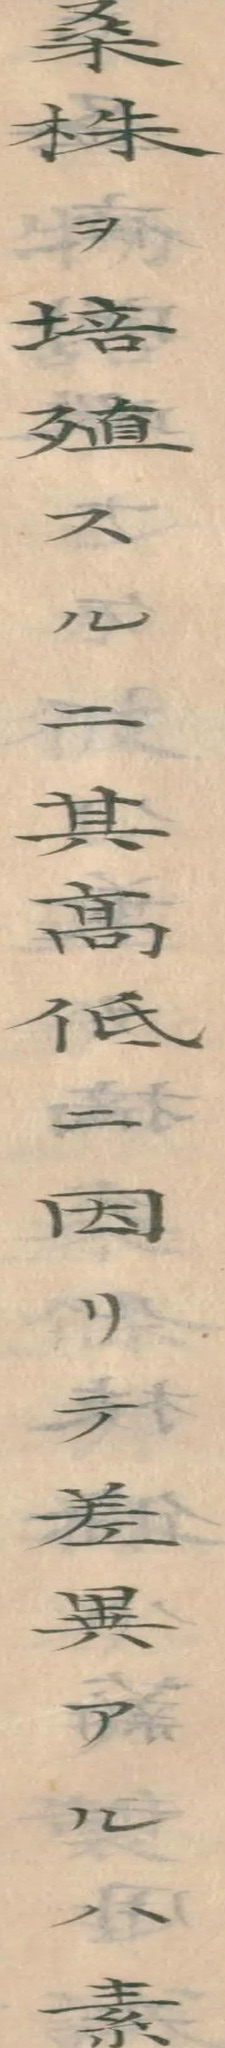柔株ヲ培殖スルニ其高低ニ因リテ差異アルハ素
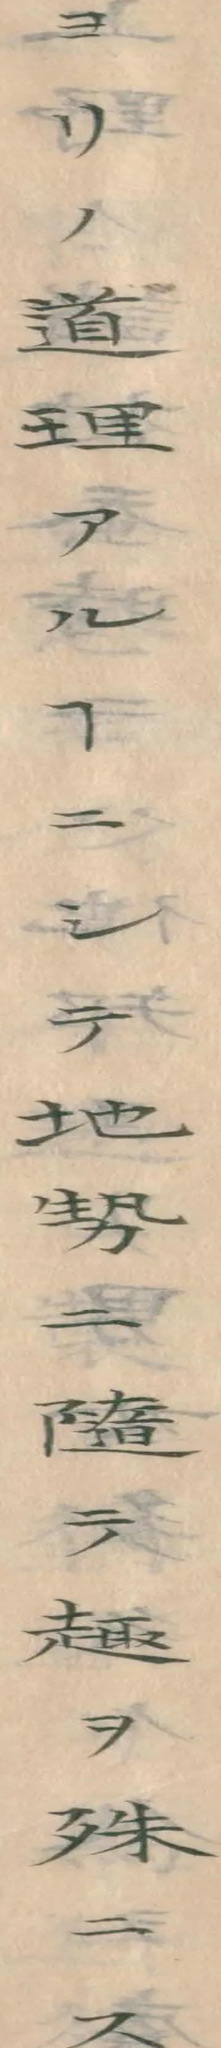ヨリノ道理アルコトニシテ地勢ニ随テ趣ヲ殊ニス
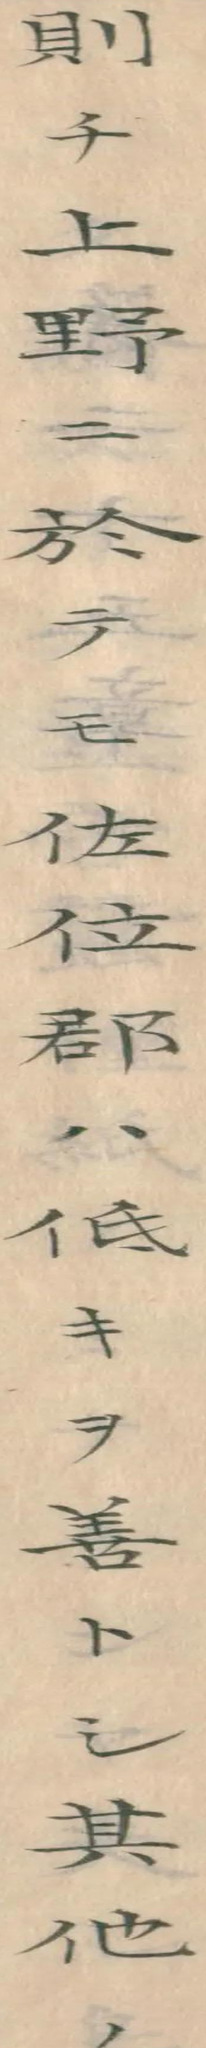則チ上野ニ於テモ佐位郡ハ低キヲ善トシ其他ノ
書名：蚕桑集成
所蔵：国立国会図書館 National Diet Library, JAPAN
